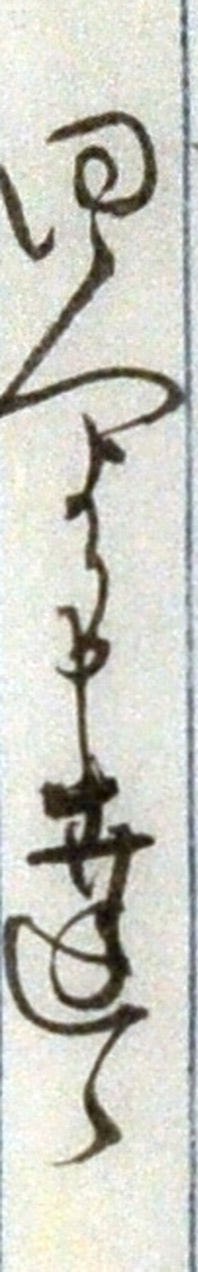同人より申達候
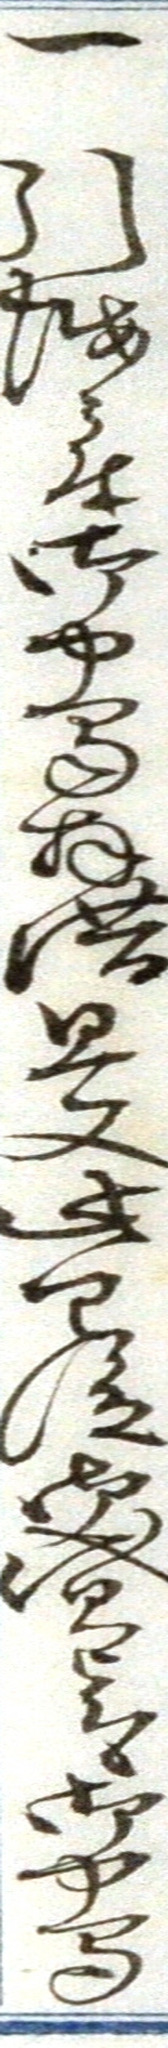一引越ニ付御中間拝借且又此已後御貸被下候御中間

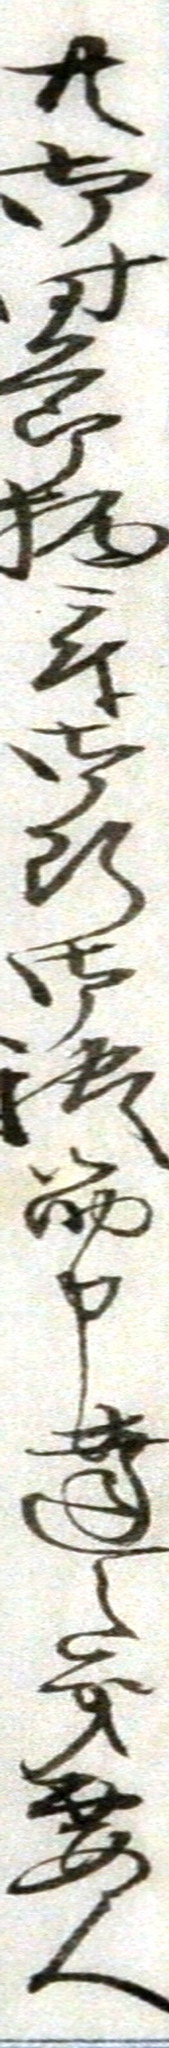共御時節柄ニ付御断御禮筋申達候義要人
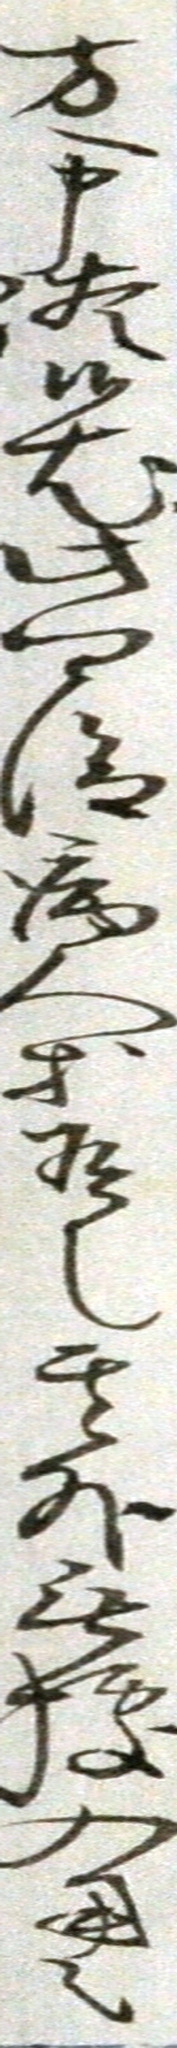方へ申談候尤此已後病人抔有之其外無拠入用之
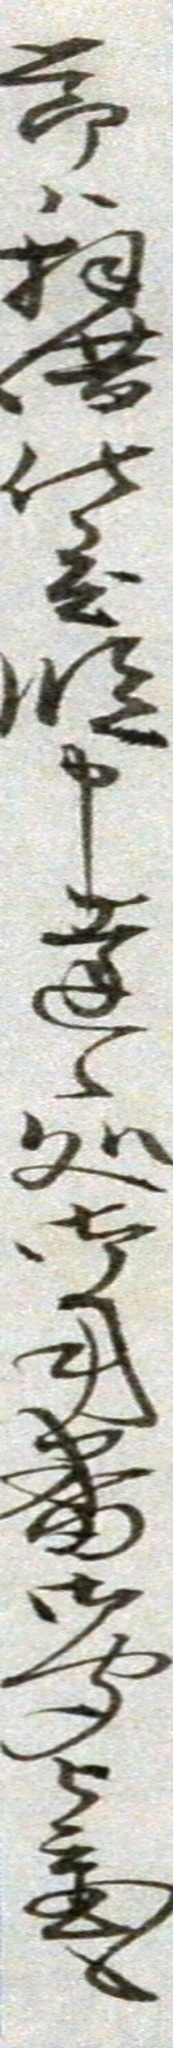節ハ拝借仕度段申達候処御用番御聞被置候
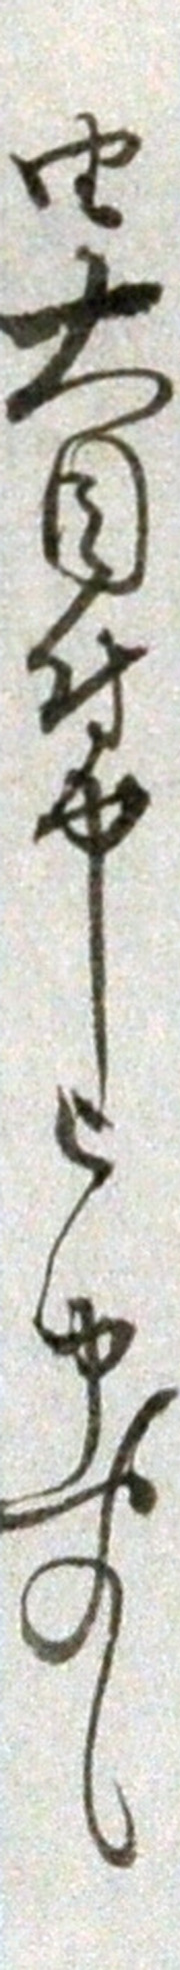由大目付中被申聞候
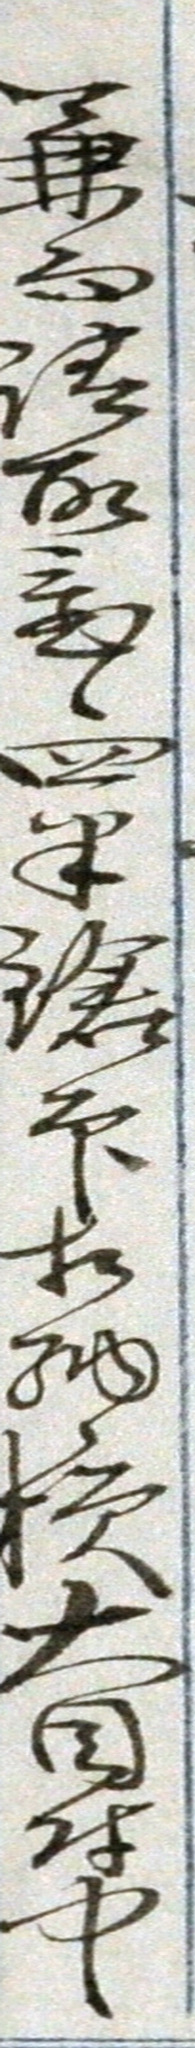一兼而請取置候四半鎗印相納候様大目付中
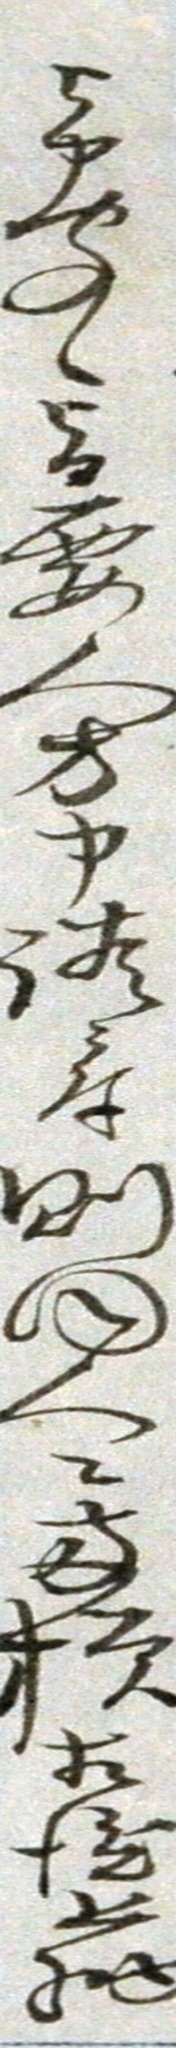被申聞候旨要人方申談ニ付則同人ニ両様相渡上納
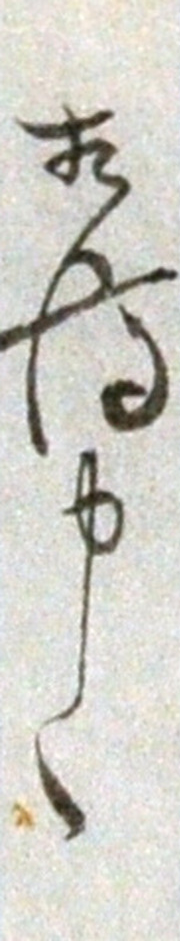相済申候
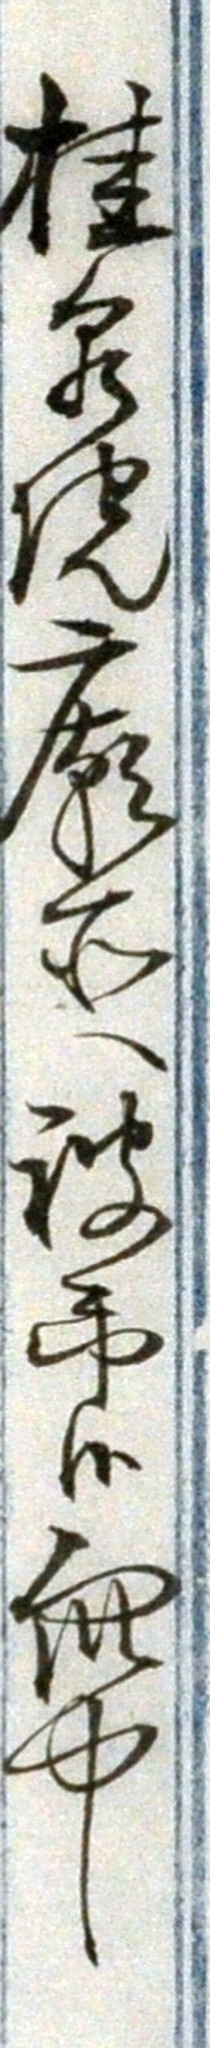桂泉院廟所へ被弔候衆中
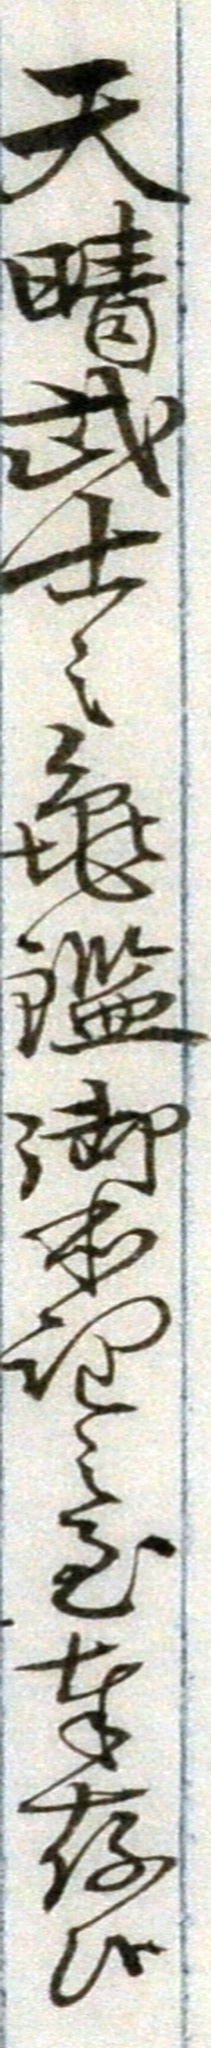天晴武士之亀鑑御本望之至奉存候
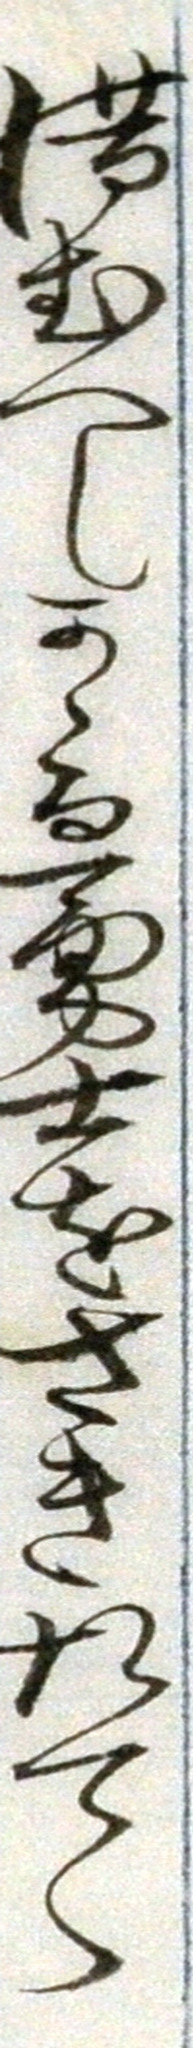惜むへし可ゝる勇士をさきたてゝ
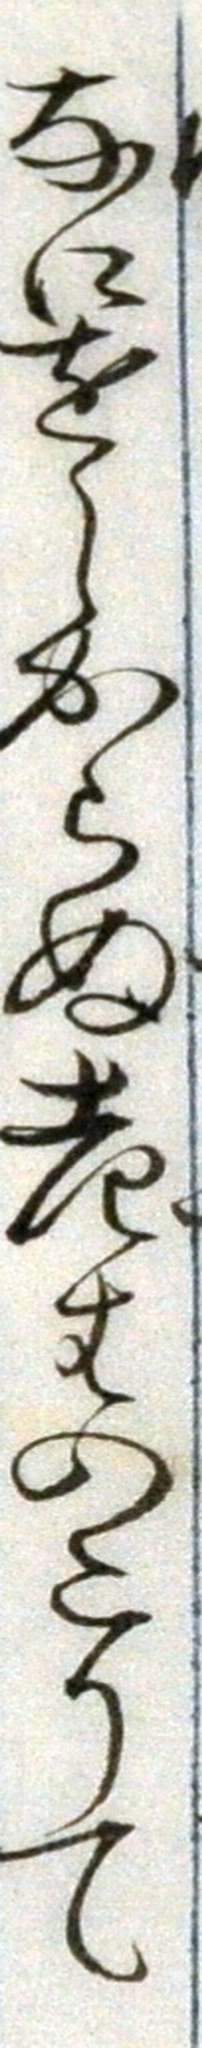奈にをしからぬ老者のこりて
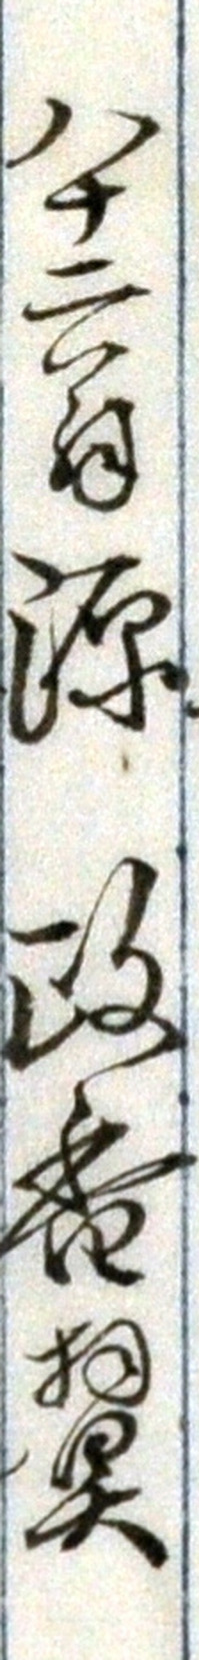八十二翁源政香翼
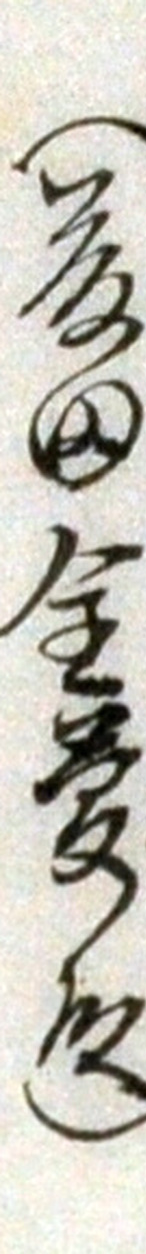(藤田全夢殿)
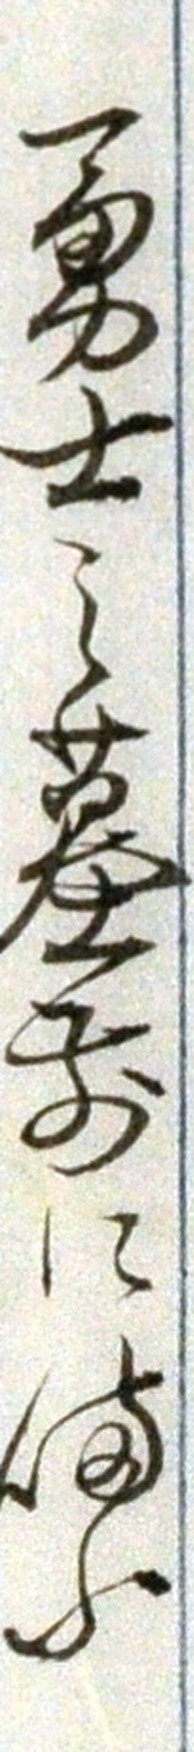勇士之墓前に備ふ
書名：川面小藤太子細有之多賀谷唯右衛門ヲ打果候一件
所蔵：伊那市立高遠町図書館・合同会社AMANE
